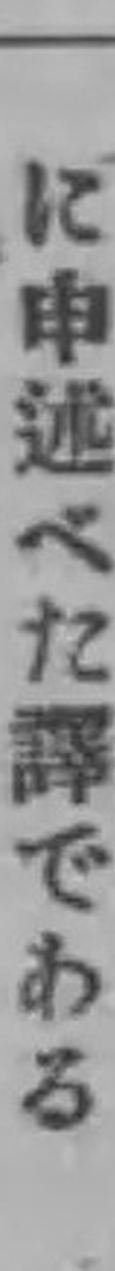に申述べた訳である
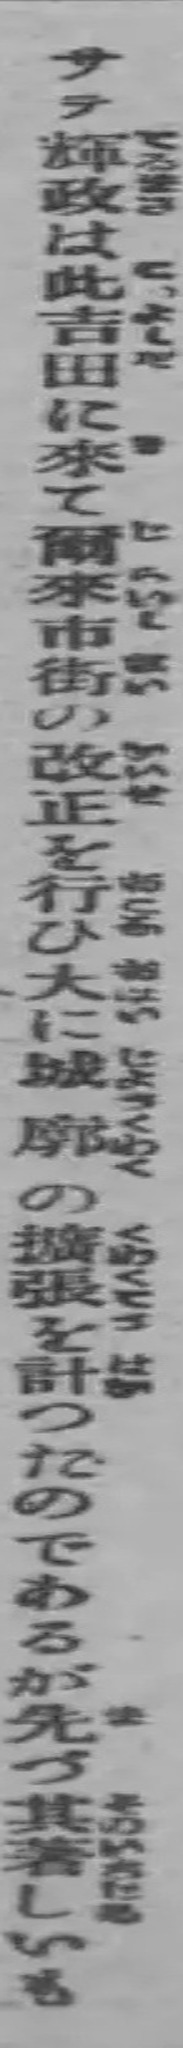輝政の事業サテ輝政は此吉田に来て爾来市街の改正を行ひ大に城廓の拡張を計つたのであるが先づ其著しいも
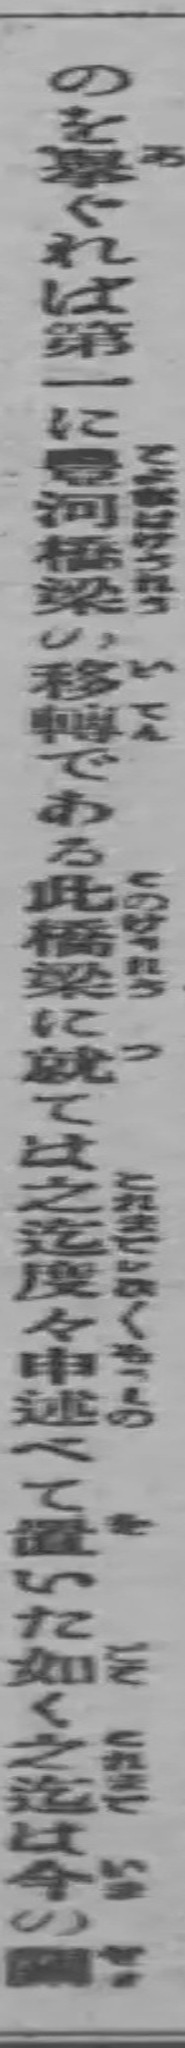豊河の橋梁のを挙ぐれば第一に豊河橋梁の移転である此橋梁に就ては之迄度々申述べて置いた如く之迄は今の関
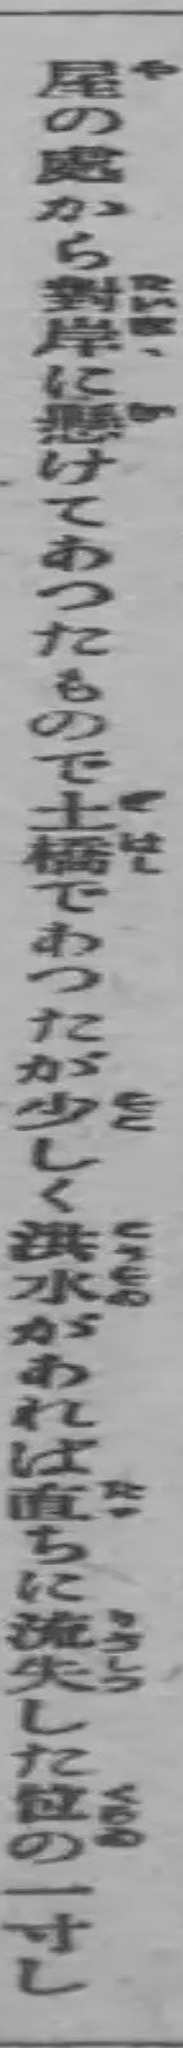屋の処から対岸に懸けてあつたもので土橋であつたが少しく洪水があれば直ちに流失した位の一寸し
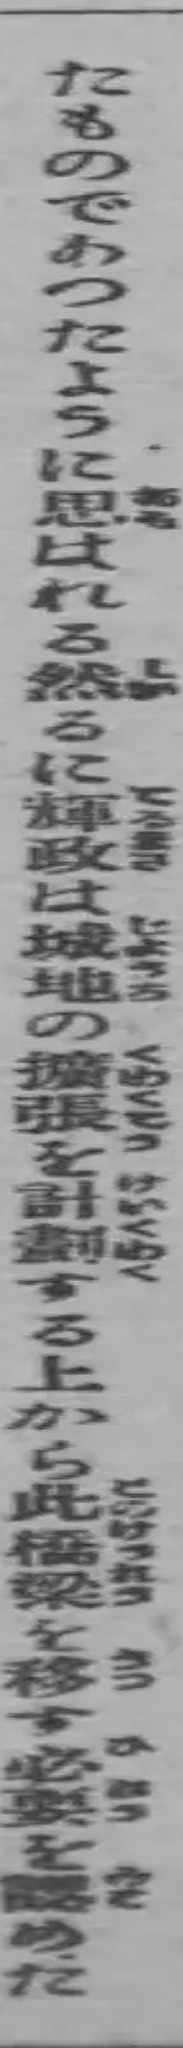たものであつたように思はれる然るに輝政は城地の拡張を計画する上から此橋梁を移す必要を認めた
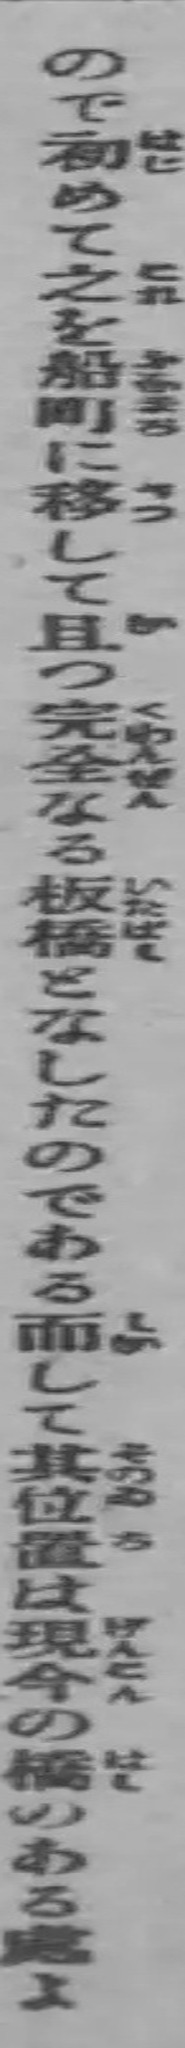ので初めて之を船町に移して且つ完全なる板橋となしたのである而して其位置は現今の橋のある処よ
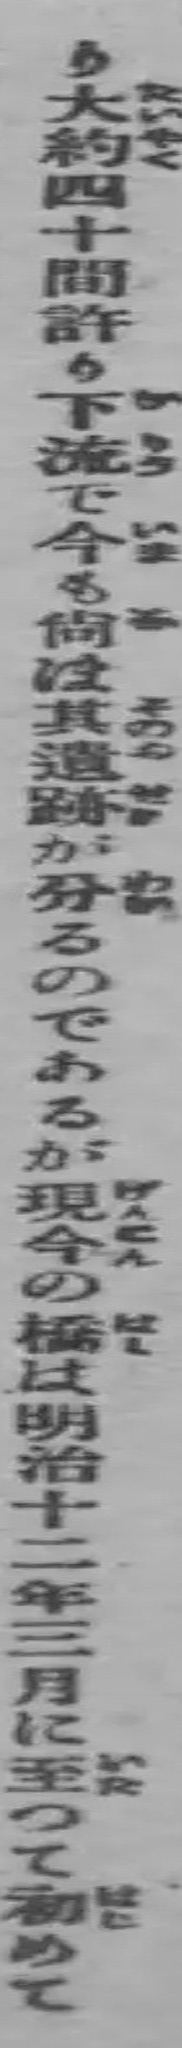り大約四十間許り下流で今も尚ほ其遺跡が分るのであるが現今の橋は明治十二年三月に至つて初めて
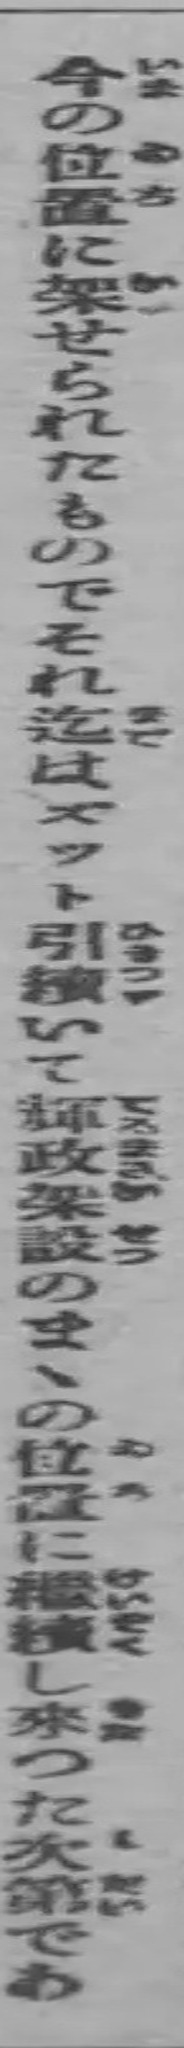今の位置に架せられたものでそれ迄はズツト引続いて輝政架設のまゝの位置に継続し来つた次第であ
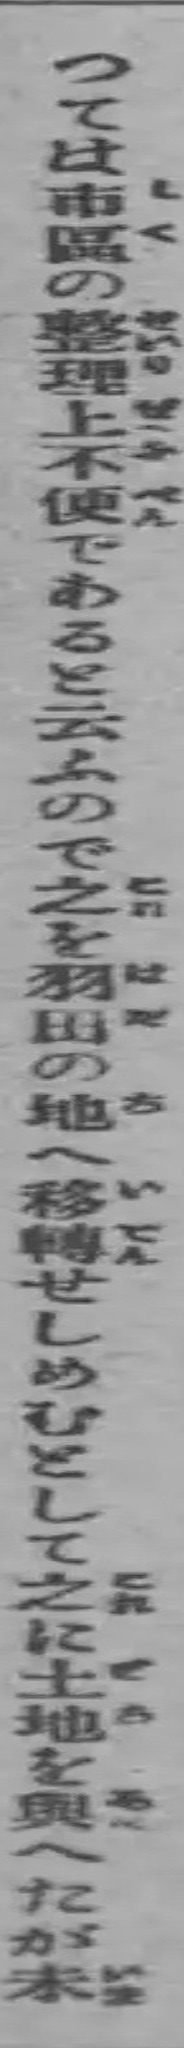つては市区の整理上不便であると云ふので之を羽田の地に移転せしめむとして之に土地を与へたが未

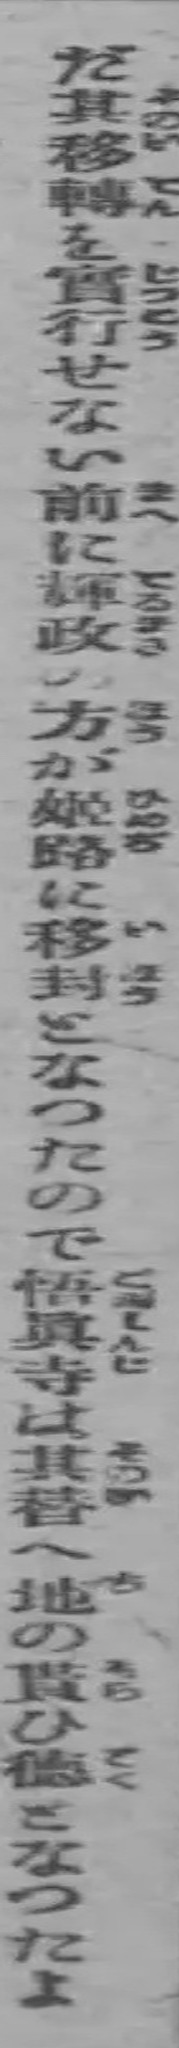だ其移転を実行せない前に輝政の方が姫路に移封となつたので悟眞寺は其替へ地の貰ひ徳となつたよ
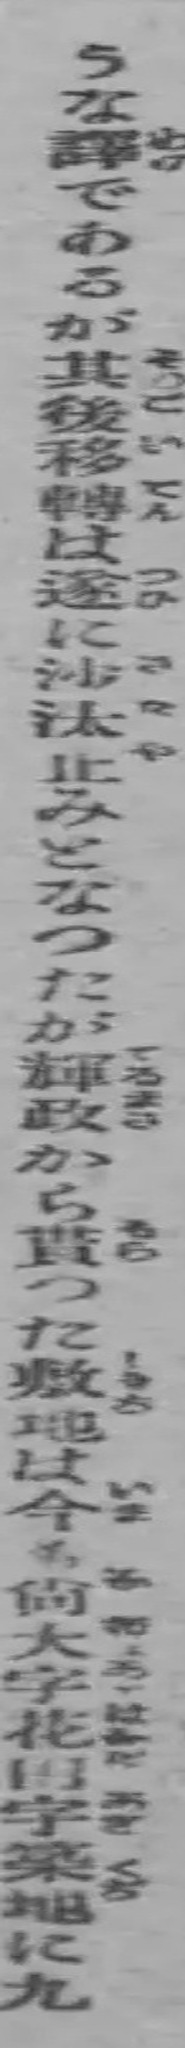うな訳であるが其後移転は遂に沙汰止みとなつたが輝政から貰つた敷地は今も尚大字花田字築地に九
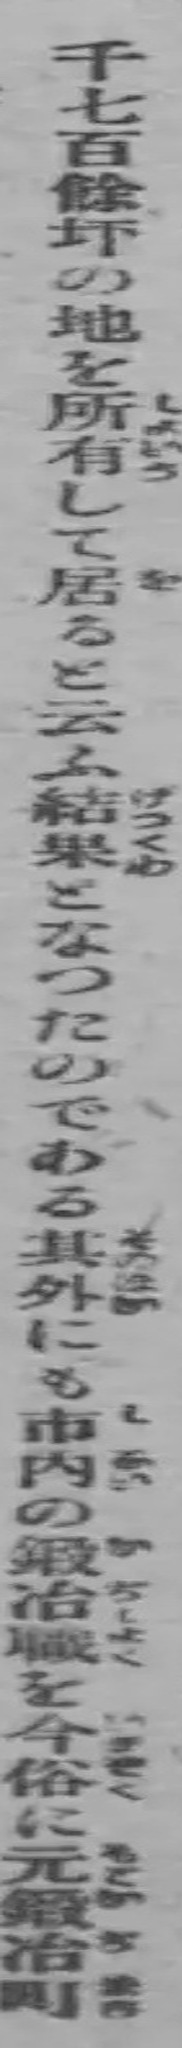千七百余圷の地を所有して居ると云ふ結果となつたのである其外にも市内の鍛冶職を今俗に元鍛冶町
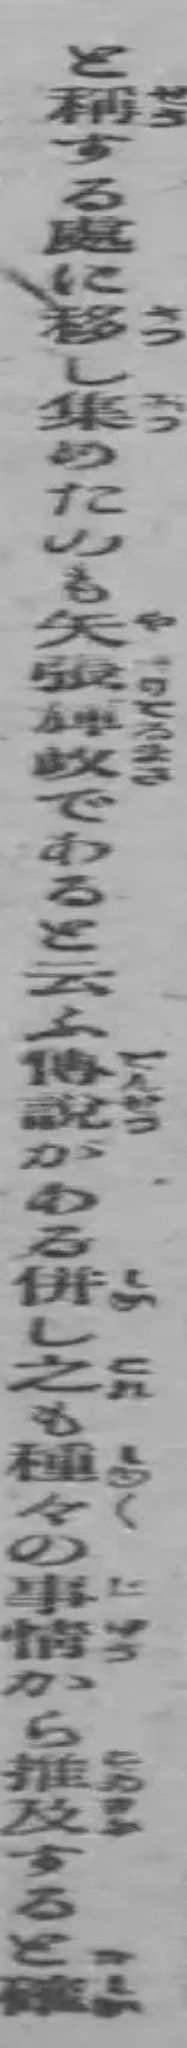と称する処に移し集めたのも矢張輝政であると云ふ伝説がある併し之も種々の事情から推及すると確
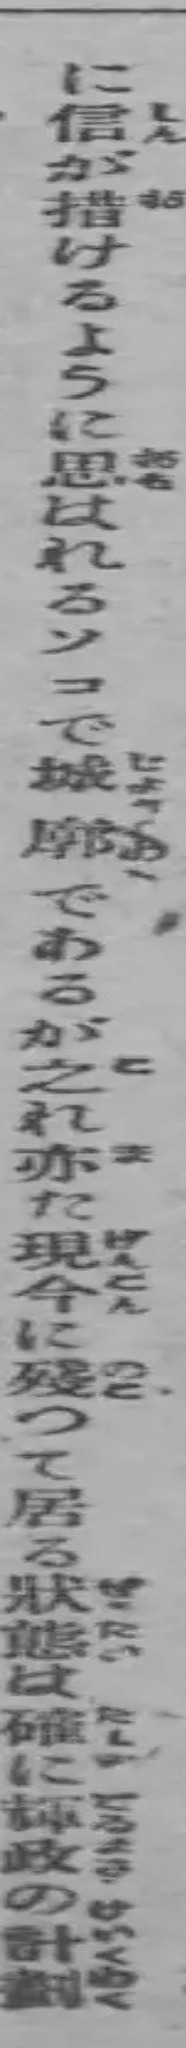城地の拡張に信が措けるように思はれるソコで城廓であるが之れ亦た現今に残つて居る状態は確に輝政の計画
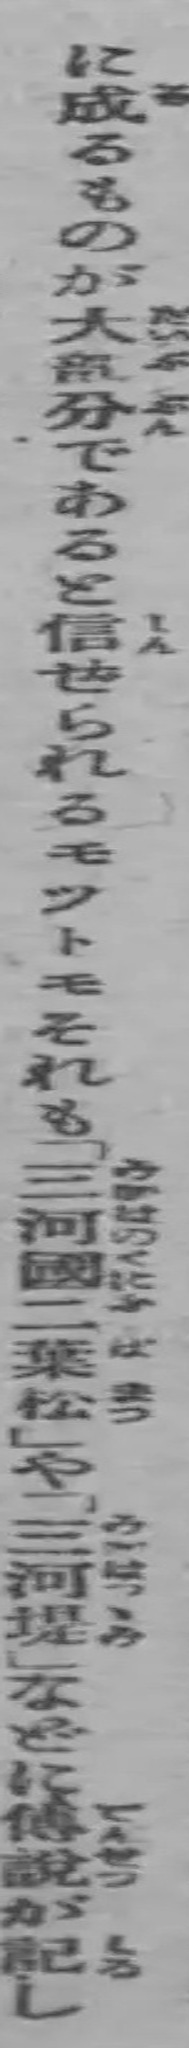に成るものが大部分であると信ぜられるモツトモそれも「三河国二葉松」や「三河堤」などに伝説が記し
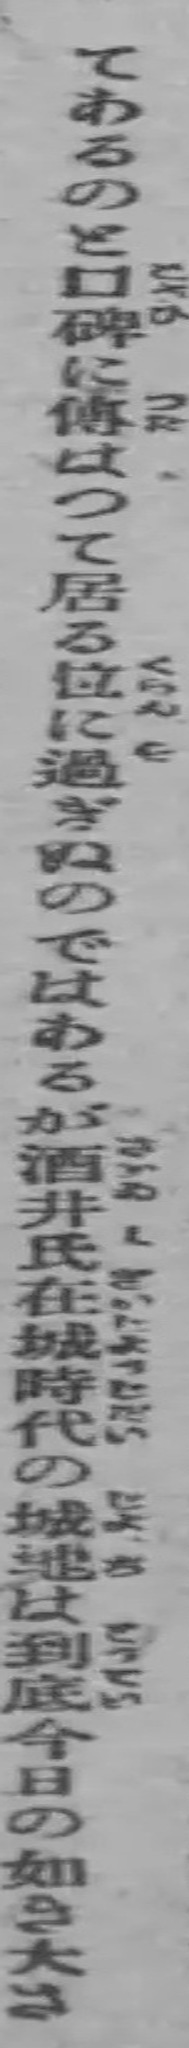てあるのと口碑に伝はつて居る位に過ぎぬのではあるが酒井氏在城時代の城地は到底今日の如き大さ
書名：豊橋市史談
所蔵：国立国会図書館 National Diet Library, JAPAN
